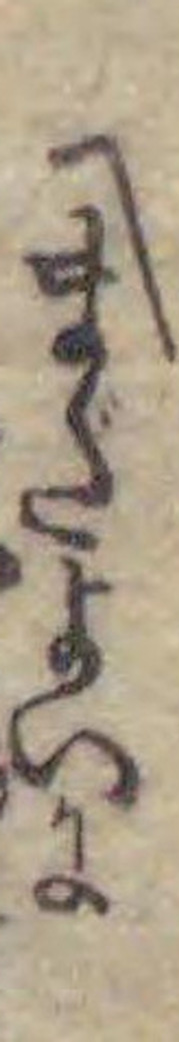〽まだよいに
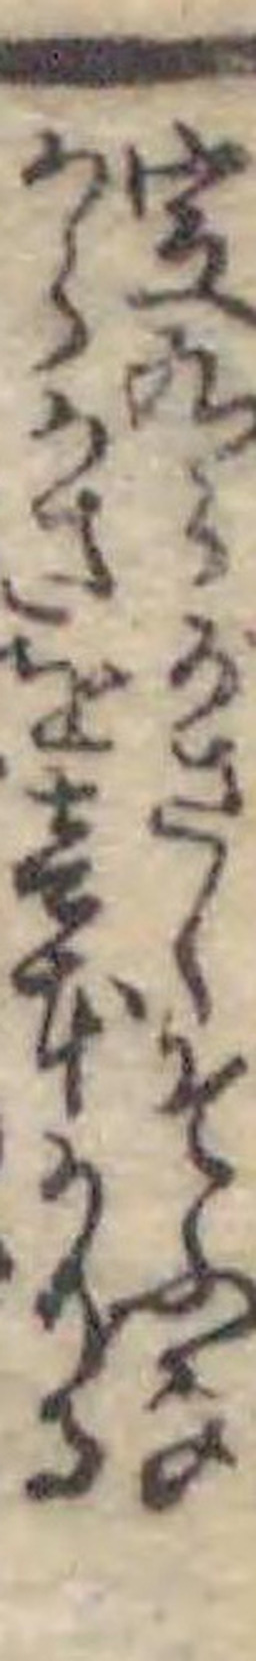からかさを壱本かりる
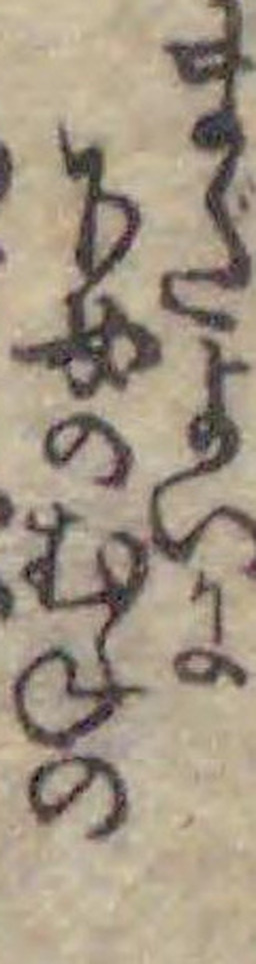下女のむねの
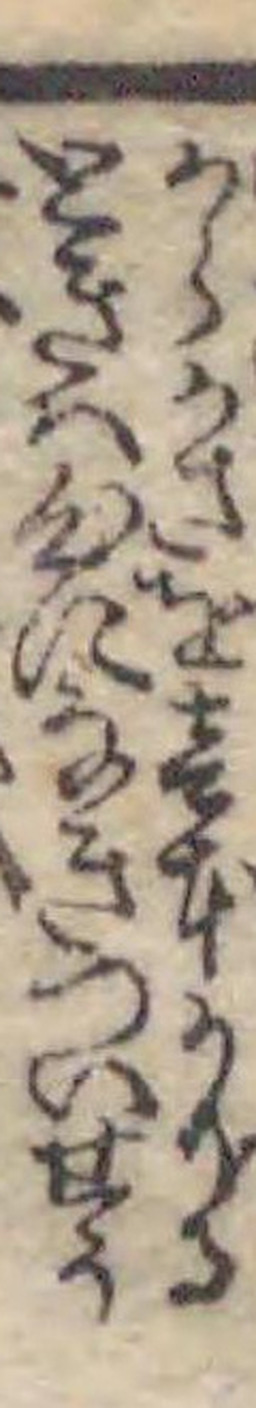ときは心になきついせう
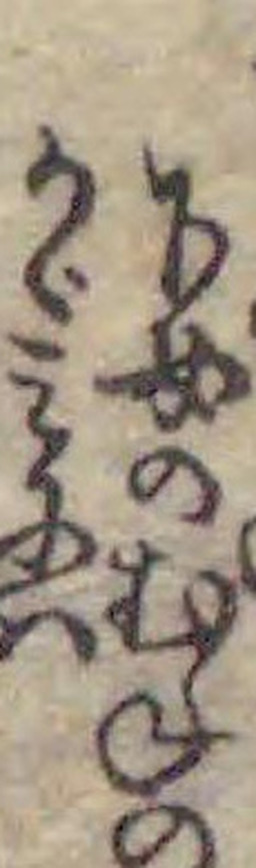かゞみには
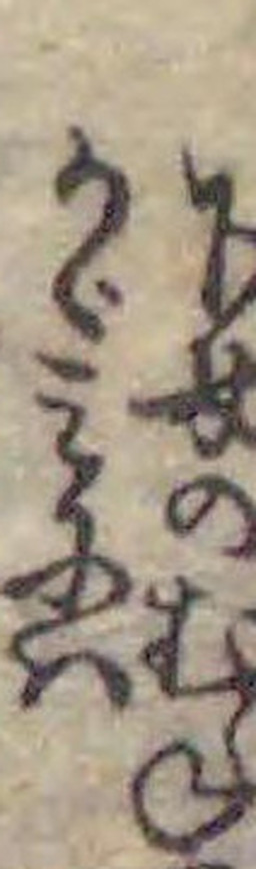かゞみには
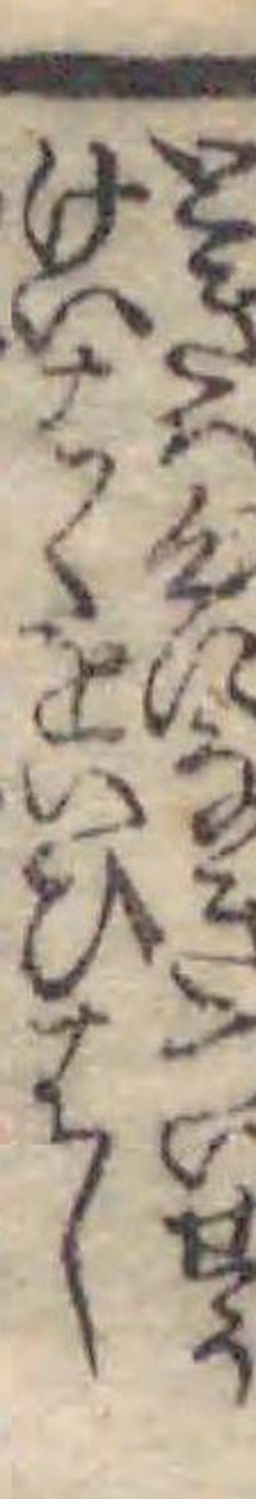けいはくをいひはし
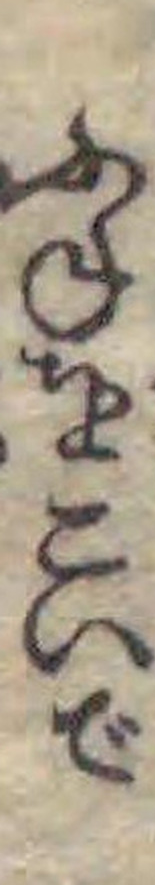ぬねをこいで
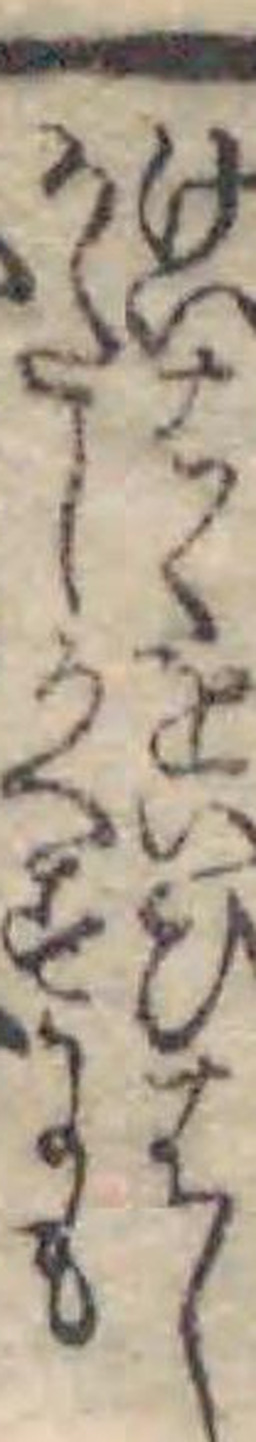かたしかへすにも
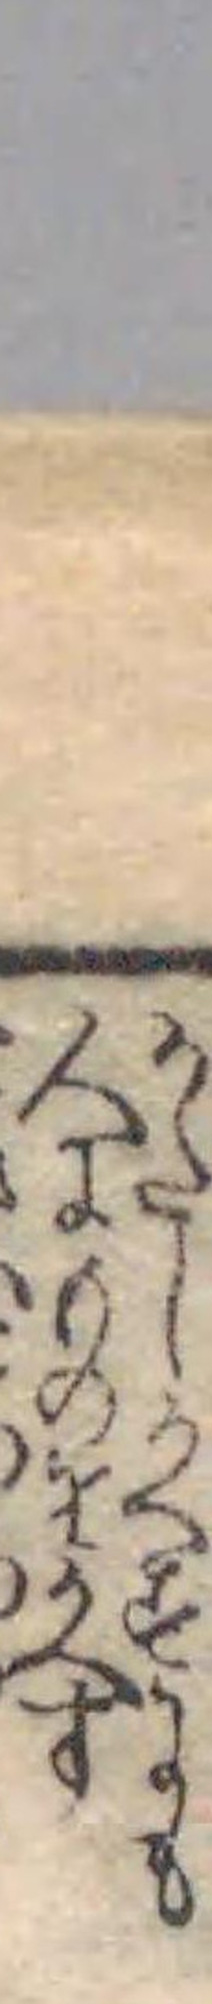人にものをかへす
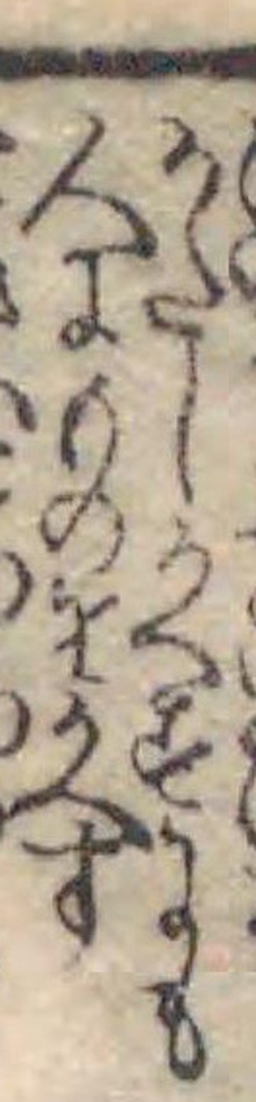人にものをかへす
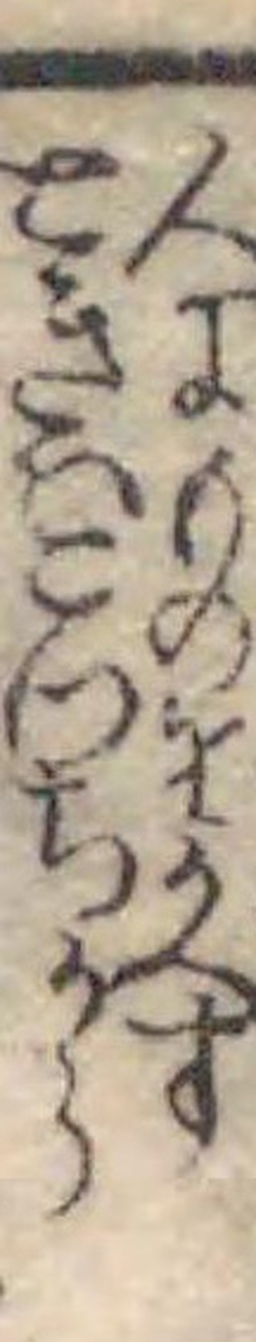ときはこつちから
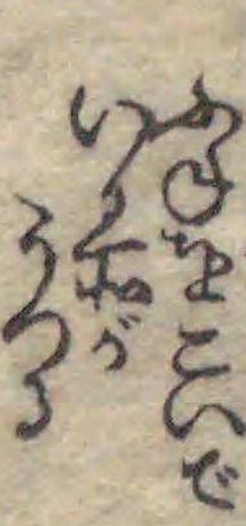いる所が
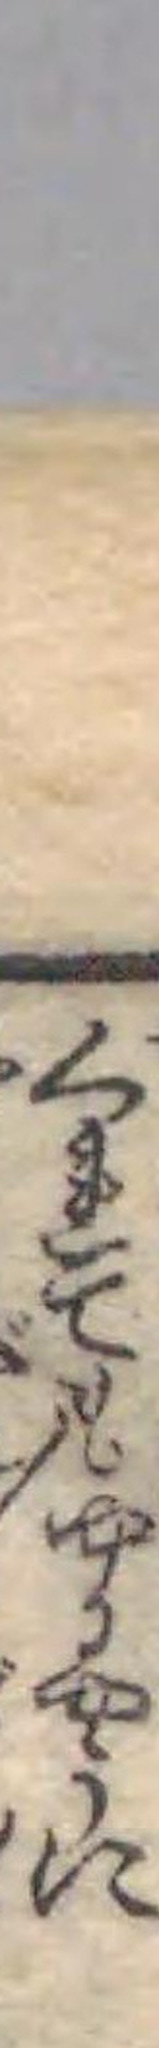くれてもやるやうに
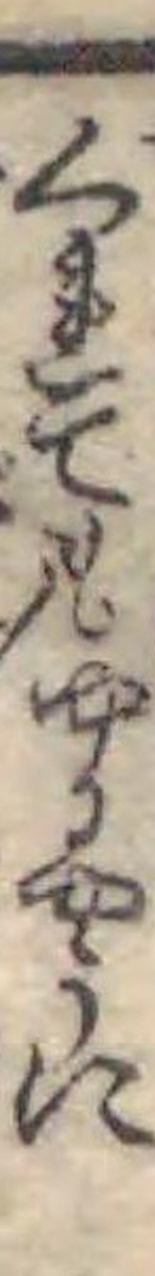くれてもやるやうに
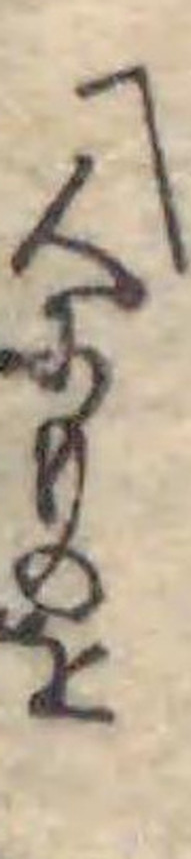〽人にものを
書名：人心鏡写絵 : 3巻
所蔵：国立国会図書館 National Diet Library, JAPAN
